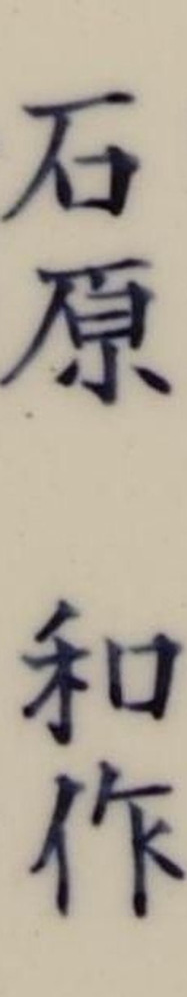石原和作
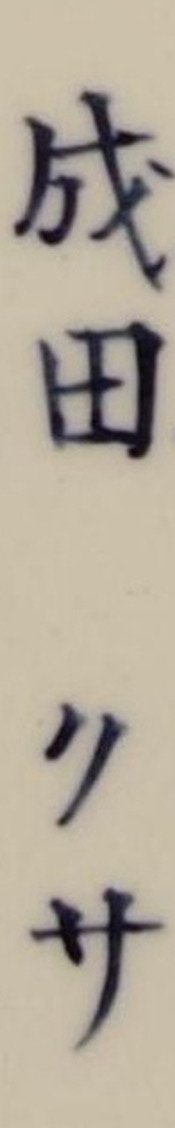成田クサ
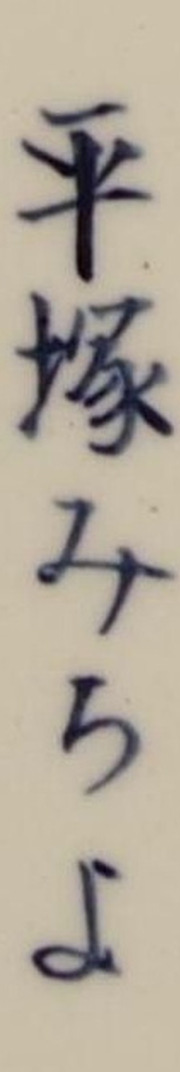平塚みちよ
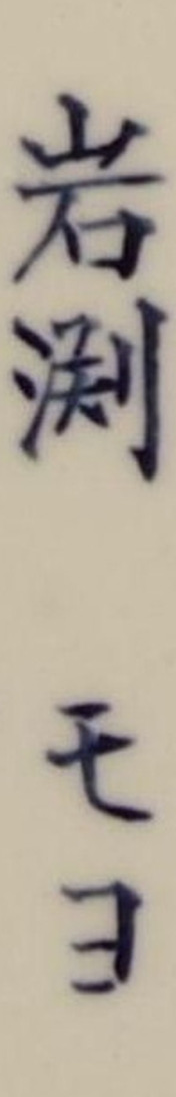岩渕モヨ
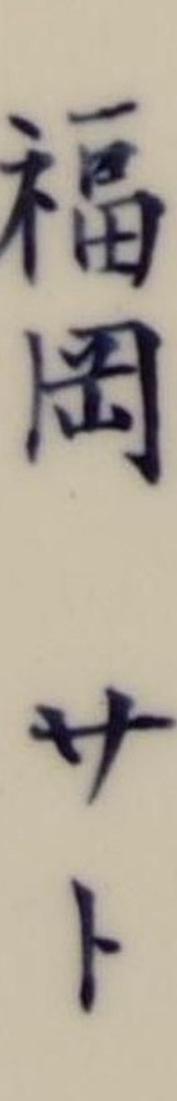福岡サト
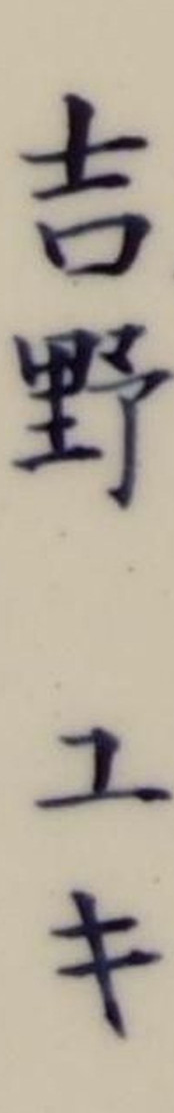吉野ユキ
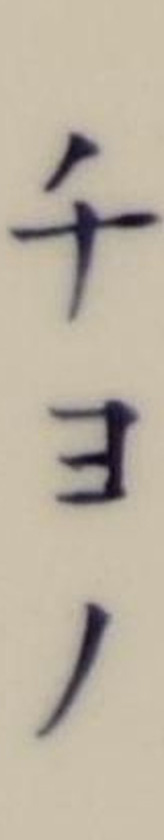チヨノ
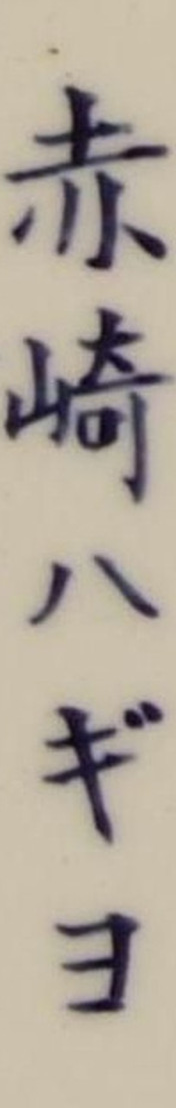赤崎ハギヨ
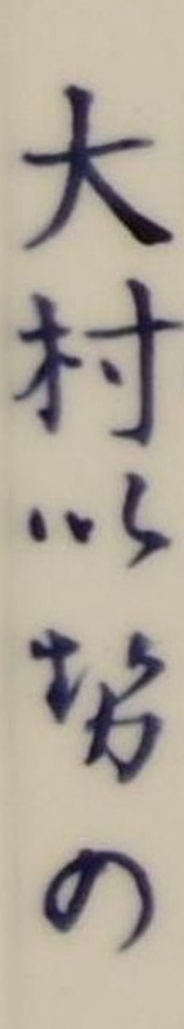大村いせの

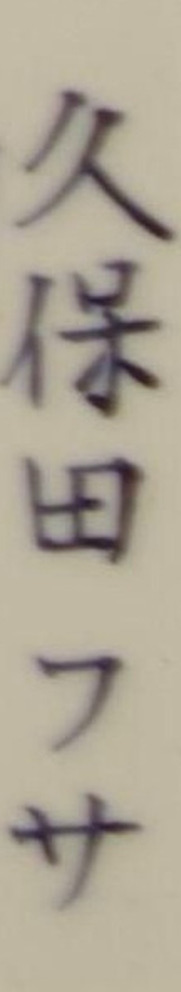久保田フサ
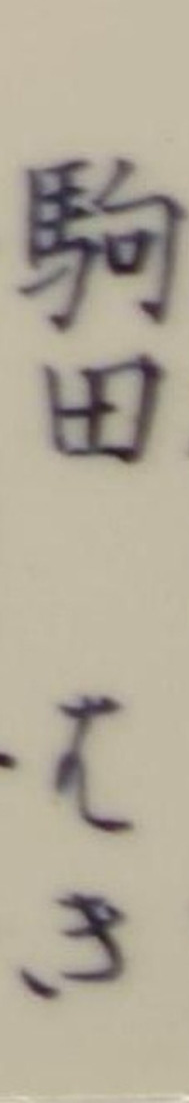駒田はき
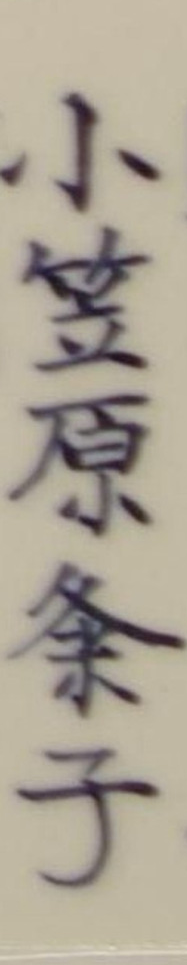小笠原粂子
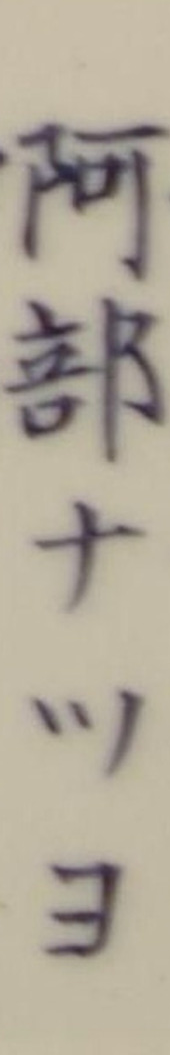阿部ナツヨ
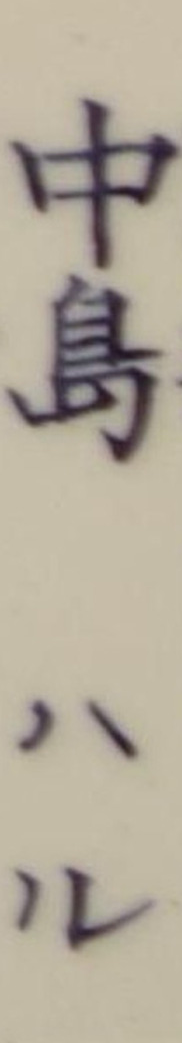中島ハル
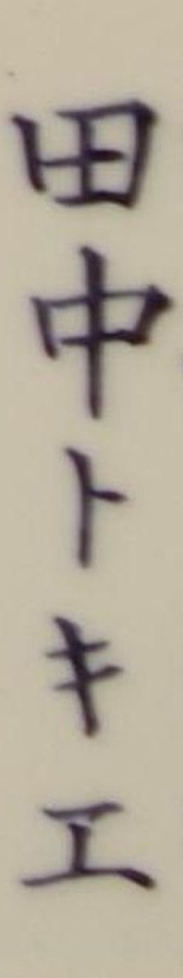田中トキエ
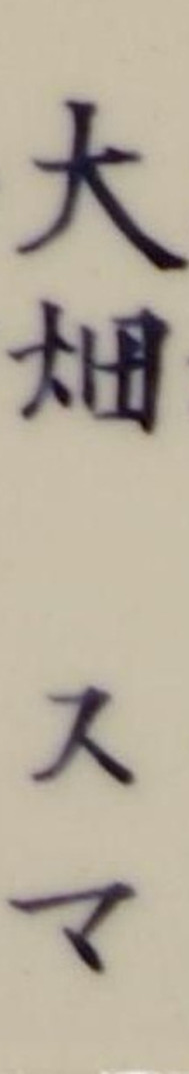大畑スマ
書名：M~S
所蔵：高野山金剛峯寺
